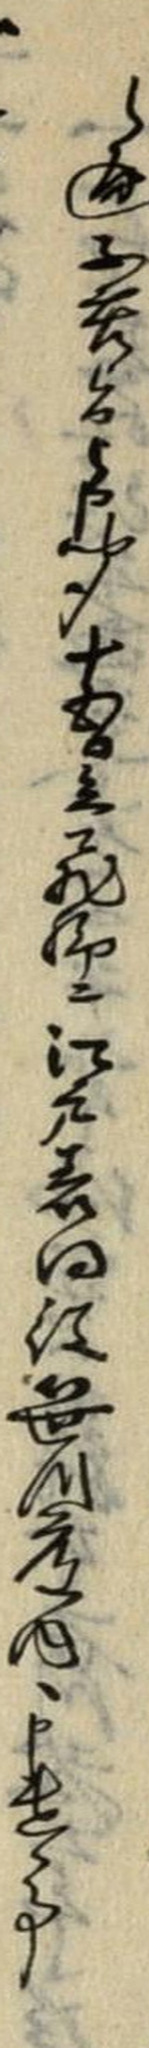之通不苦旨被申聞十五日立飛脚ニ江戸表同役笹川藤内へ申遣候事
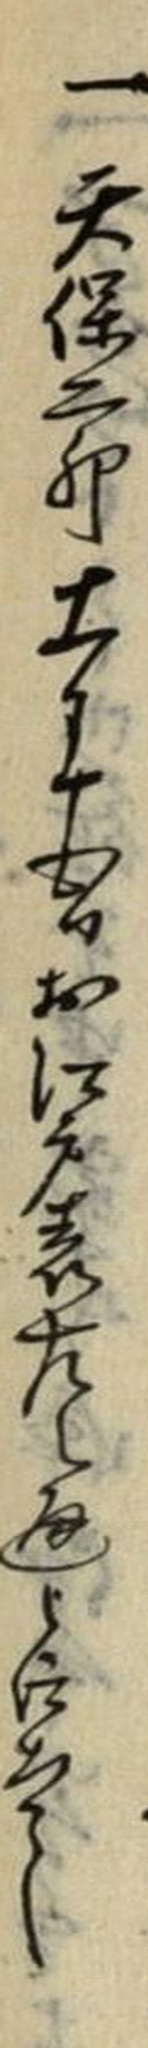一天保二卯十一月十五日於江戸表左之通被仰出之
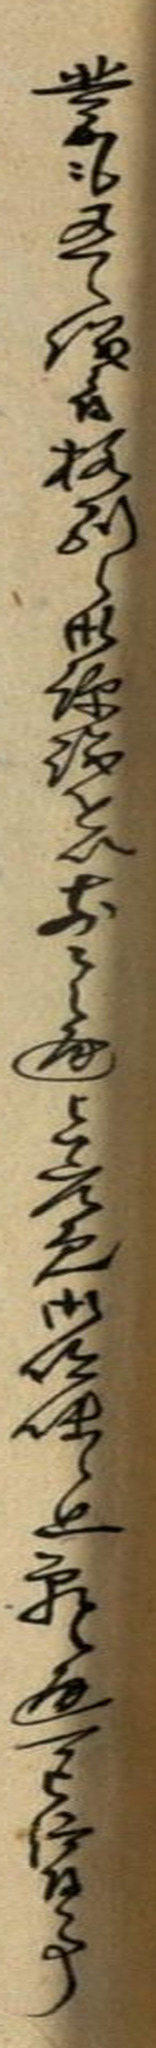業も有之儀ニ付格別之御評議を以前々之通被差免御吟味之上願之通可被仰付候事
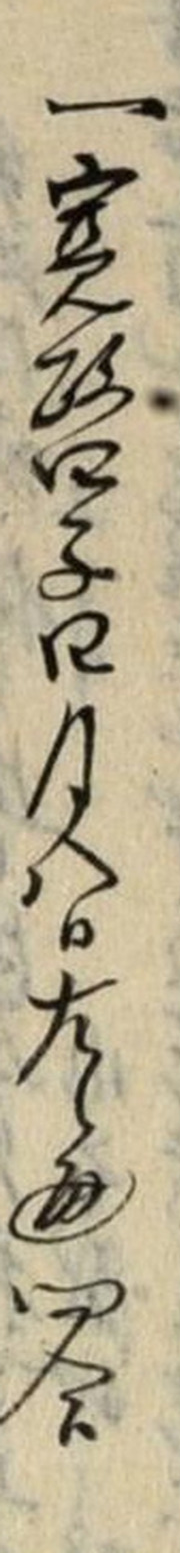一寛政四子四月八日左之通問合
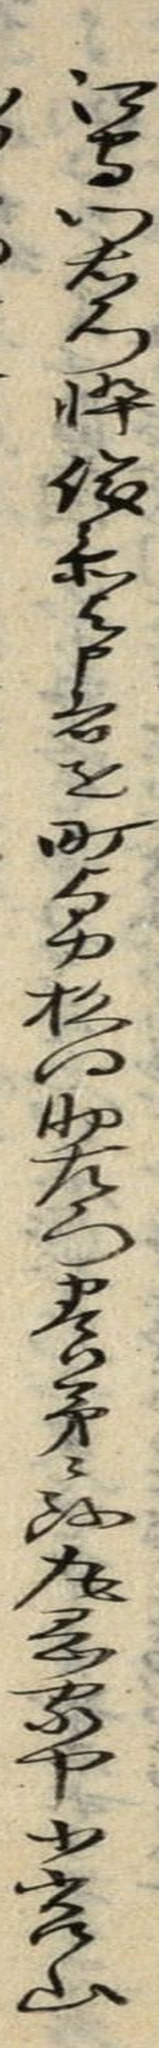江守門左衛門忰儀兵衛与申者を町与力杉田助左衛門養弟ニ致丸岡家中小宮山
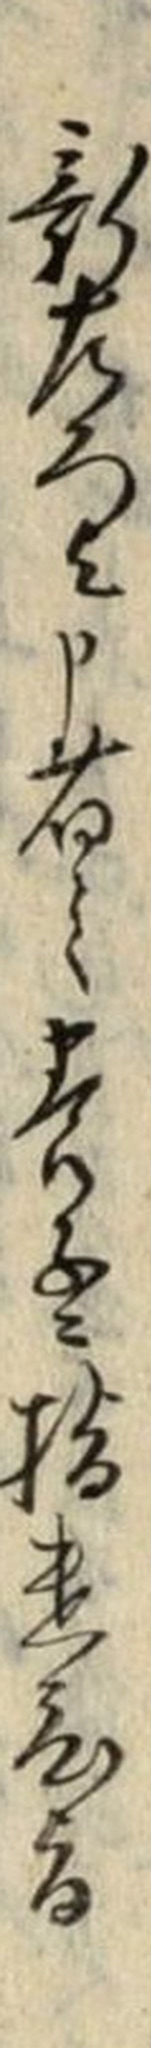新左衛門与申者之養子ニ指遣度旨
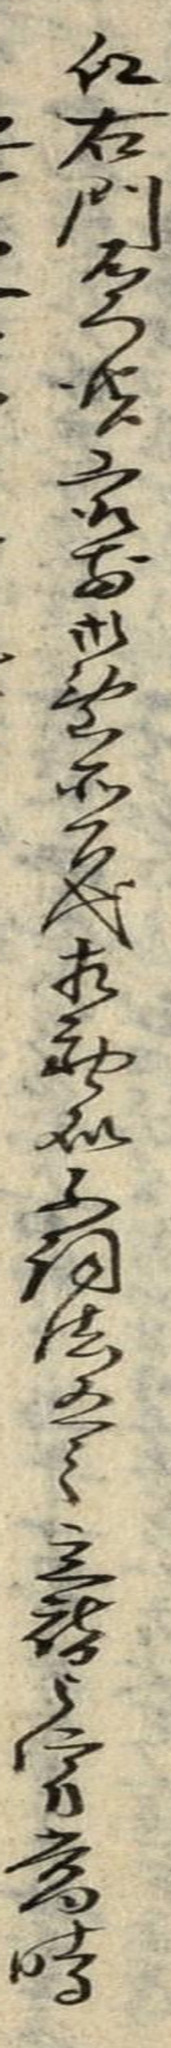但右門左衛門儀ハ最前御台所下代相勤候処不調法有之立替被仰付当時
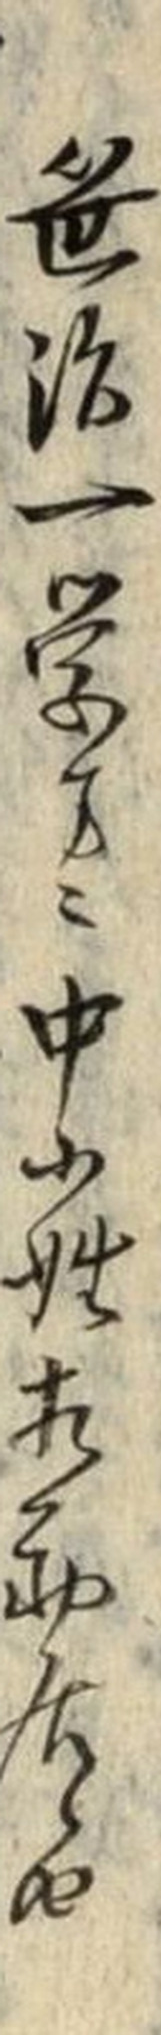笹治一学方ニ中小姓相勤居候由
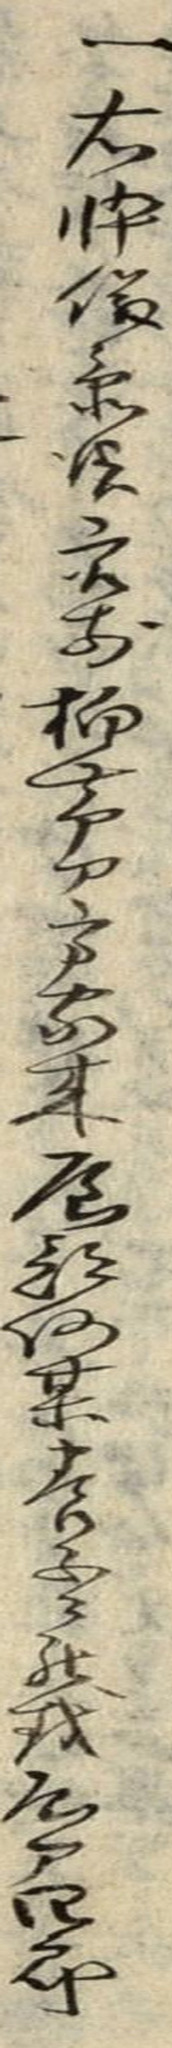一右忰儀兵衛儀ハ最前狛帯刀方家来屋部何某養子ニ罷越屋部四郎
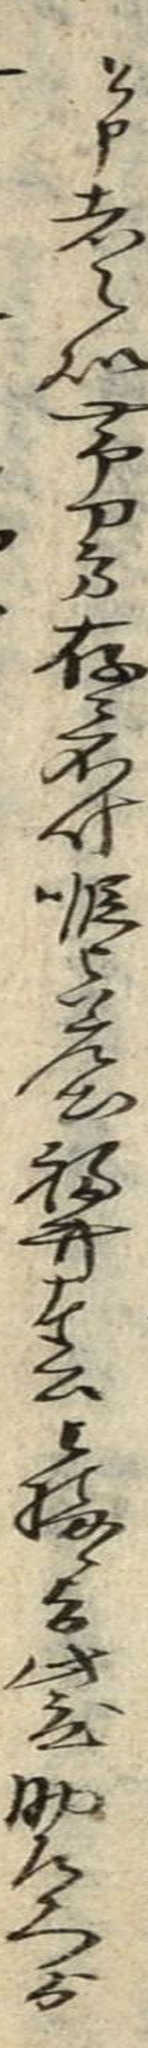と申者之処帯刀方存ニ不叶暇被差出福井奉公被構候旨此度助左衛門ゟ
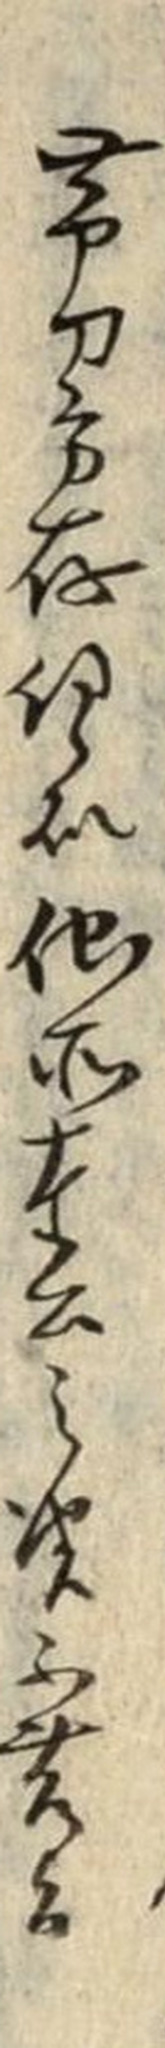帯刀方存伺候処他所奉公之儀ハ不苦旨
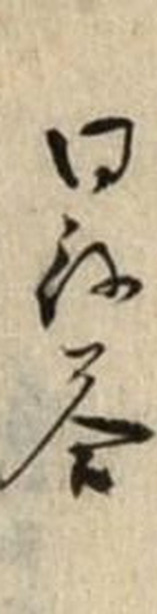同役答
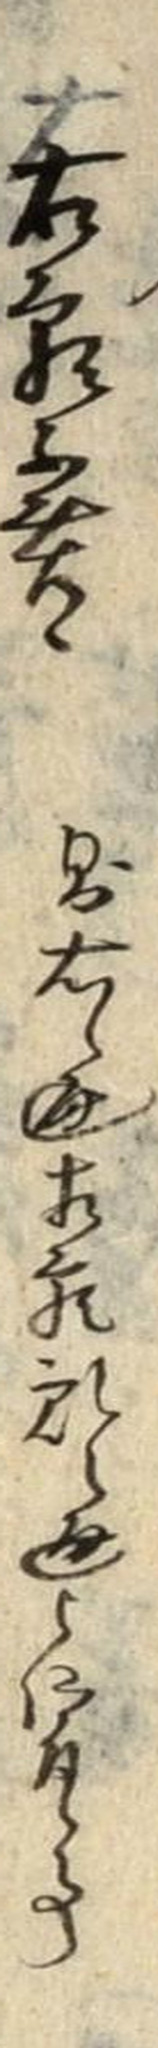右願不苦候則右之通相願願之通被仰付候事

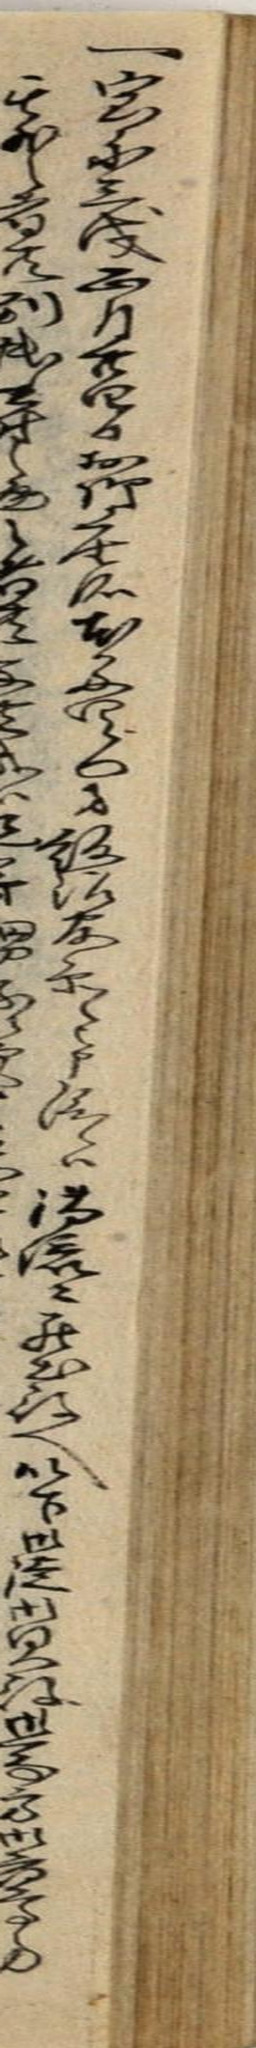一宝永三戌正月廿四日於御座所本多四郎右衛門方飯沼官兵衛へ被申渡候ハ御流ニ罷出役人以下御徒御貝役御馬方御鷹方
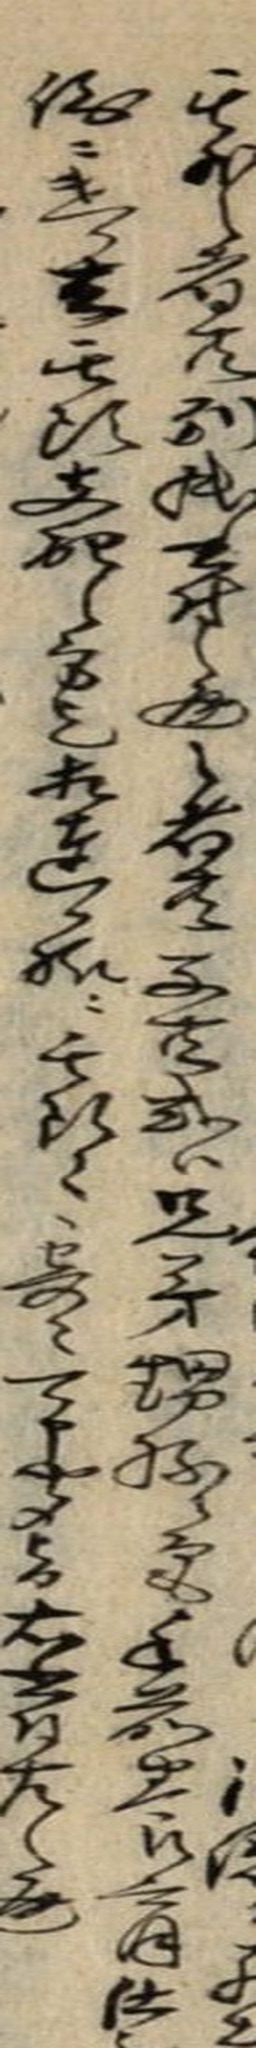儀ニ遣候者其頭支配之方迄相達候様ニ其頭々へ寄々可申聞旨右書付左之通
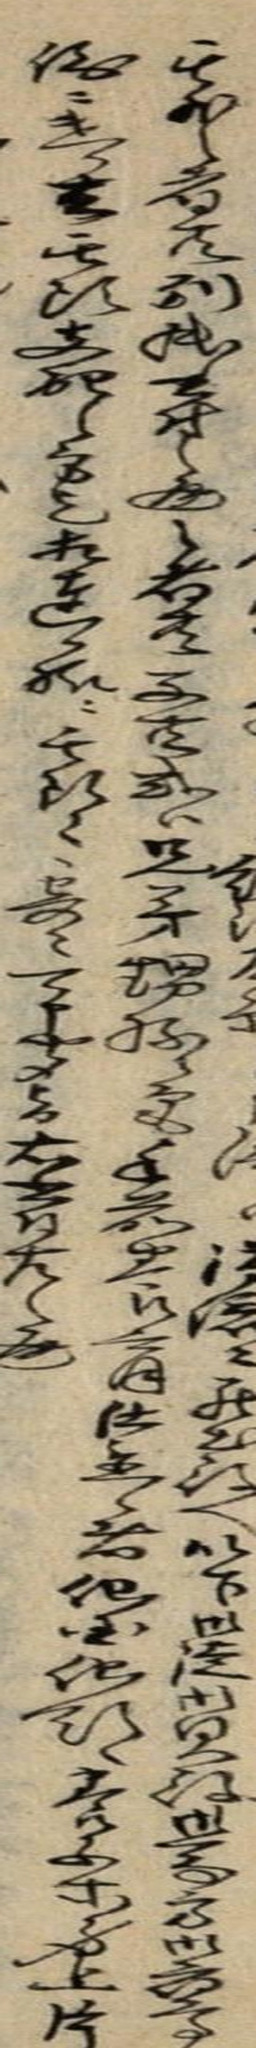儀ニ遣候者其頭支配之方迄相達候様ニ其頭々へ寄々可申聞旨右書付左之通
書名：養子縁組之部
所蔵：福井県文書館 Fukui Prefectural Archives
